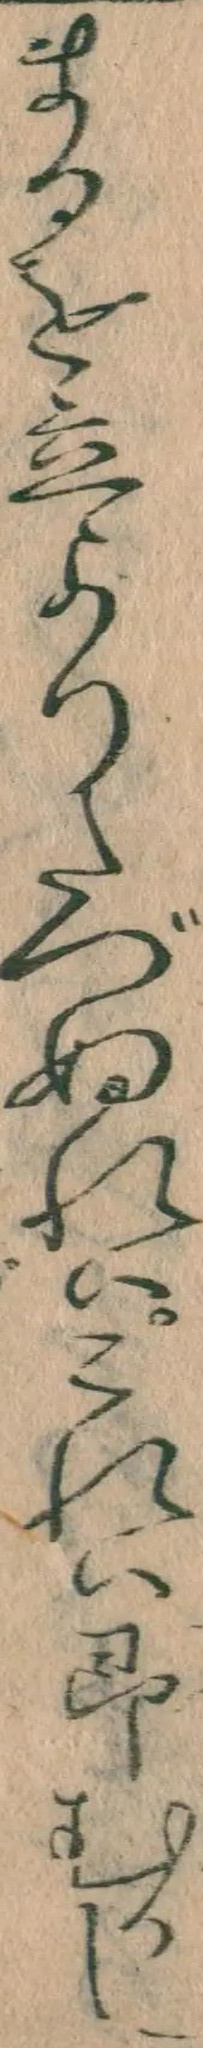まるを立よりたづぬれは。これは即むかし
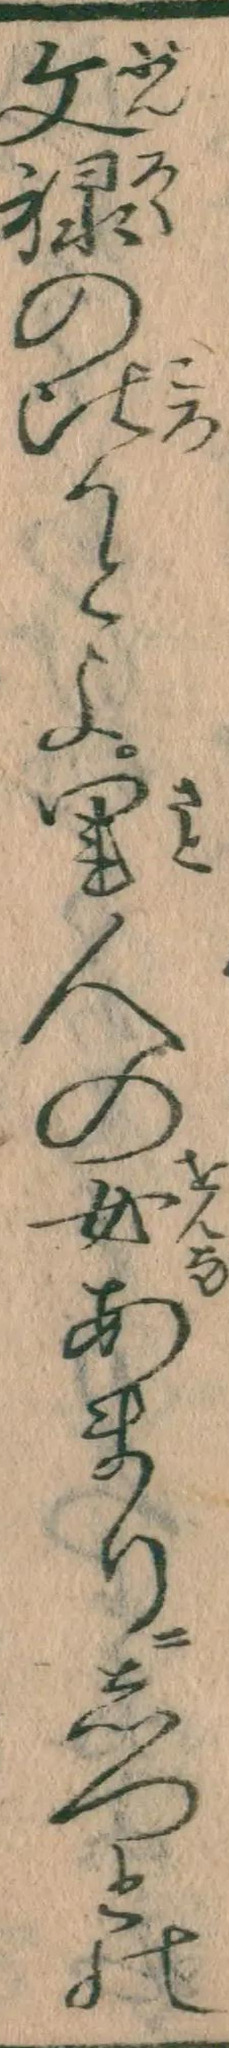文禄の比かとよ。里人の女あまりしつとの
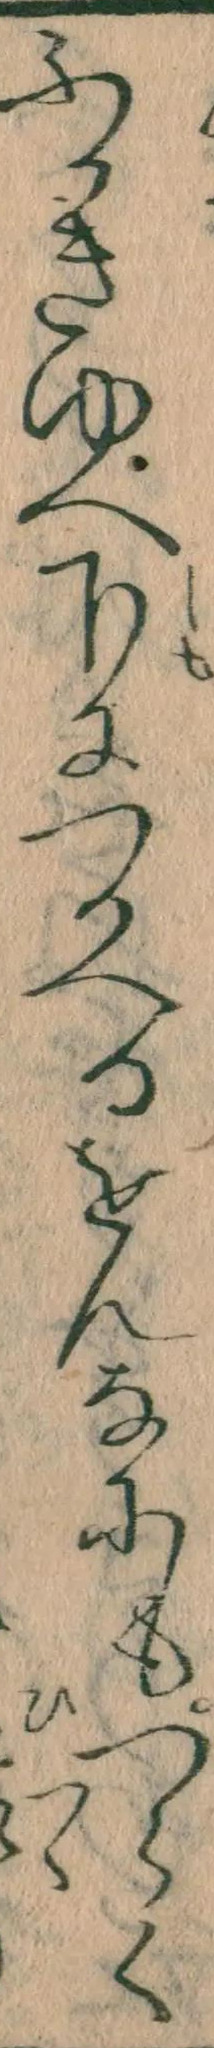ふかきゆへ下につかへるをんなにも。つらく
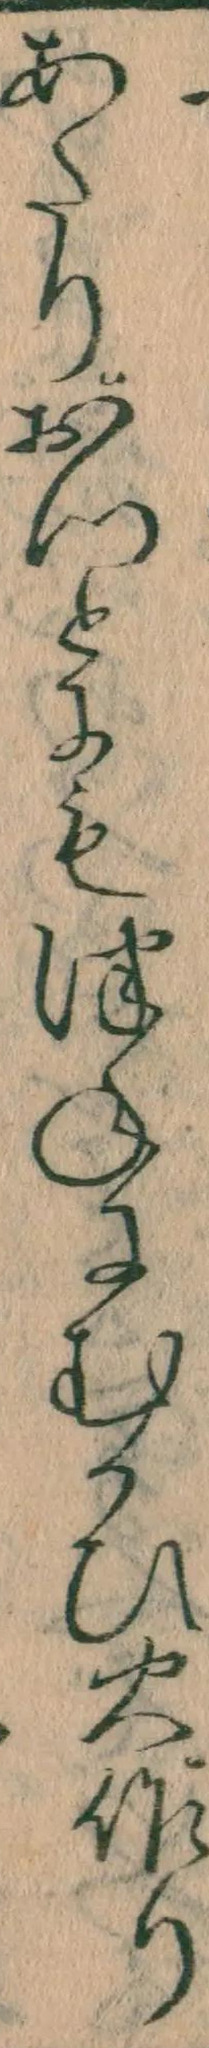あたり。おつとにもつねにむかひ火。作り
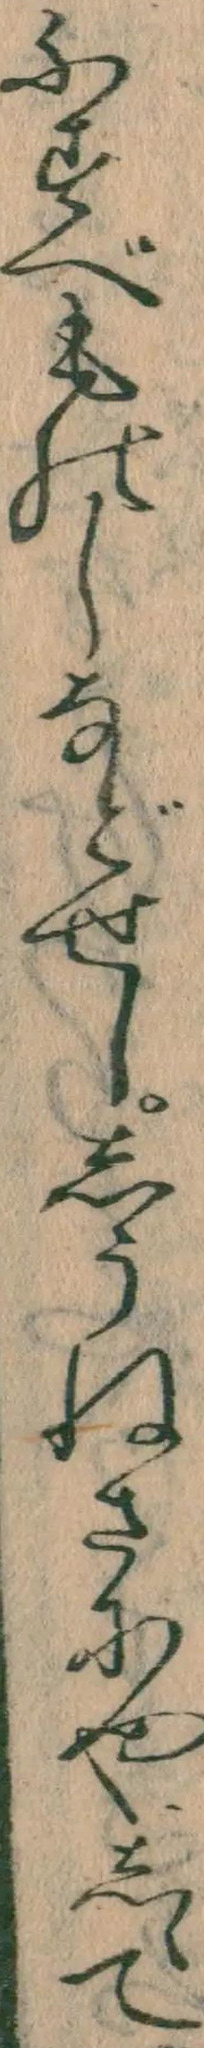ふすべものしなどせし。しうねさにやしゝて
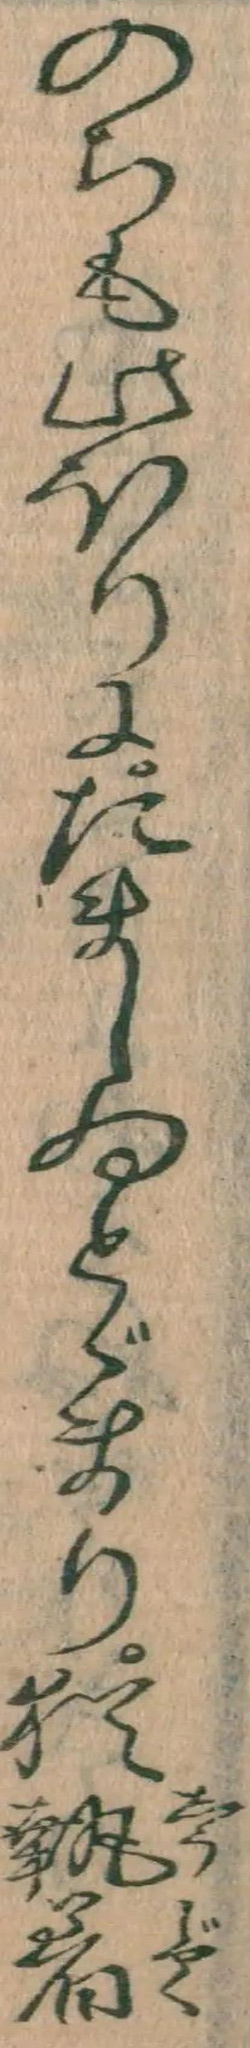のちも此ほりに。たましゐとゞまり。猶執着
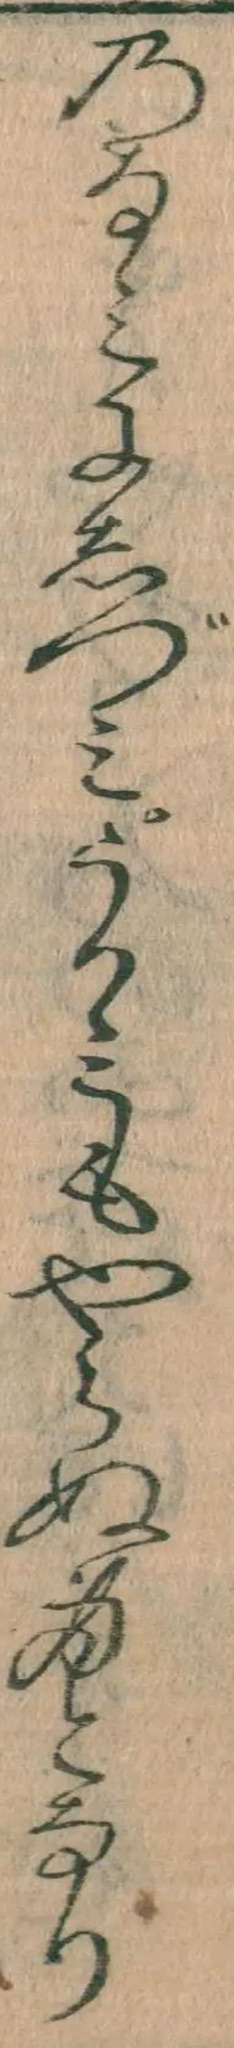のなみにしづみ。うかみもやらぬ身となり
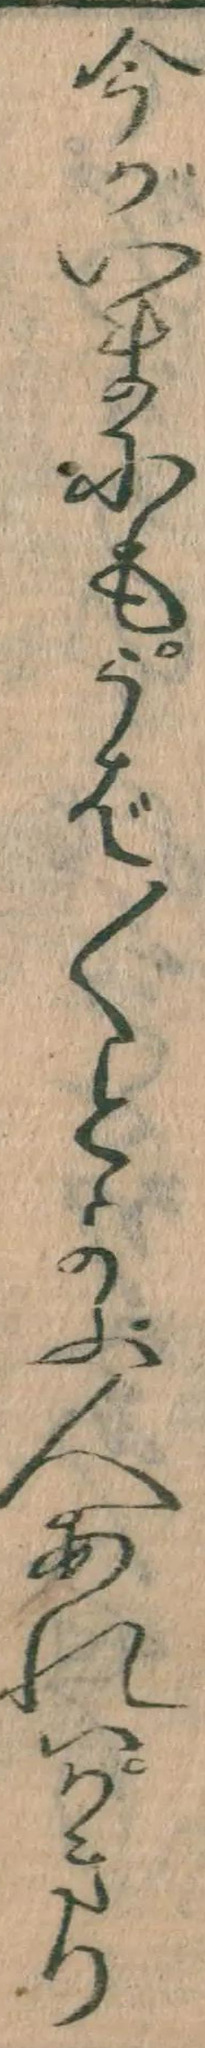今がいまにも。うば〳〵とよぶ人あれは。かきり
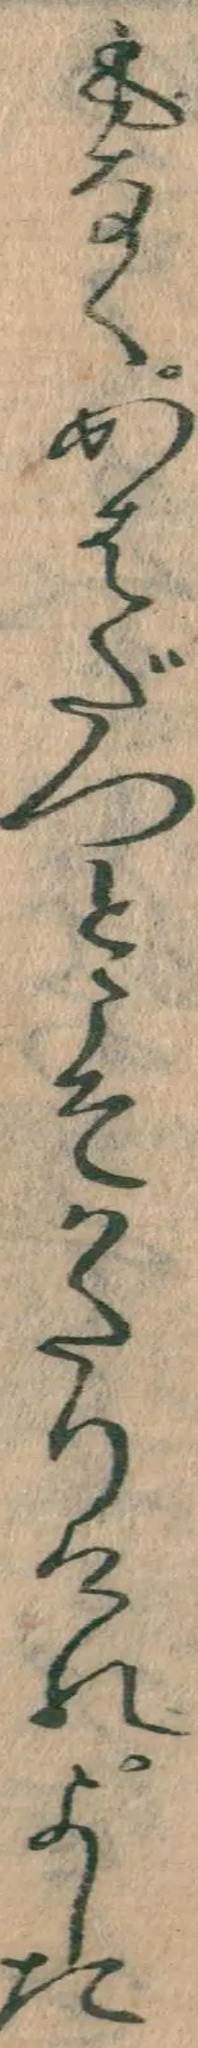もなく。あはだつとこそかたりけれ。よした
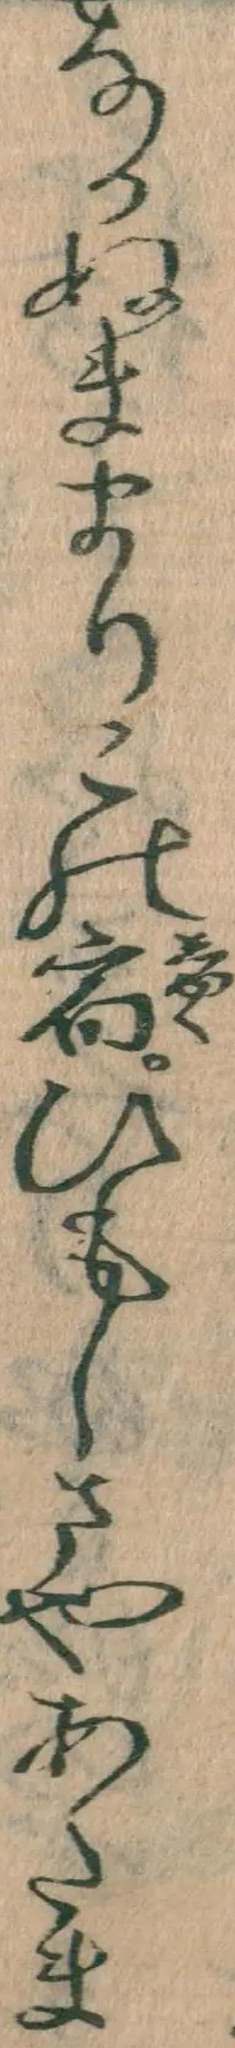なかぬままりこの宿。ひもしさやあたま
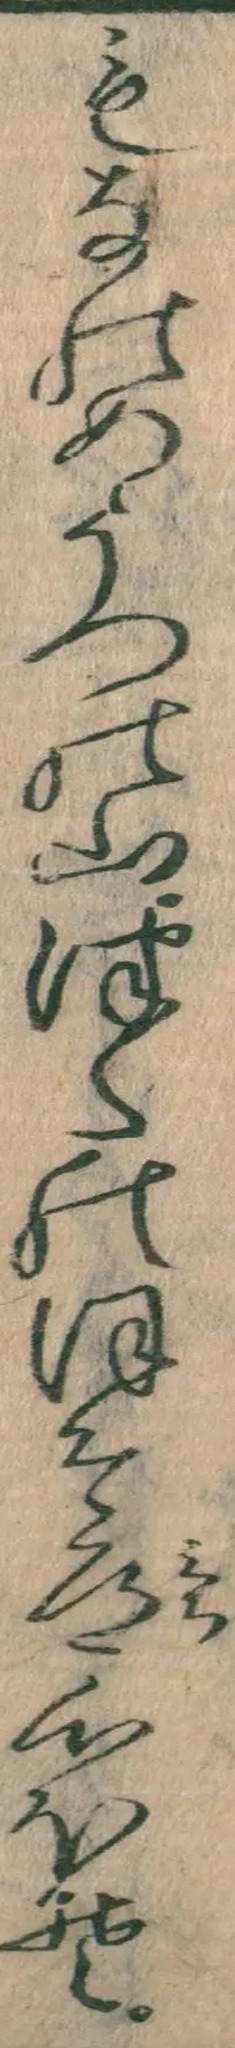もなのめうつの山。つゝのほそ道心ほそ。
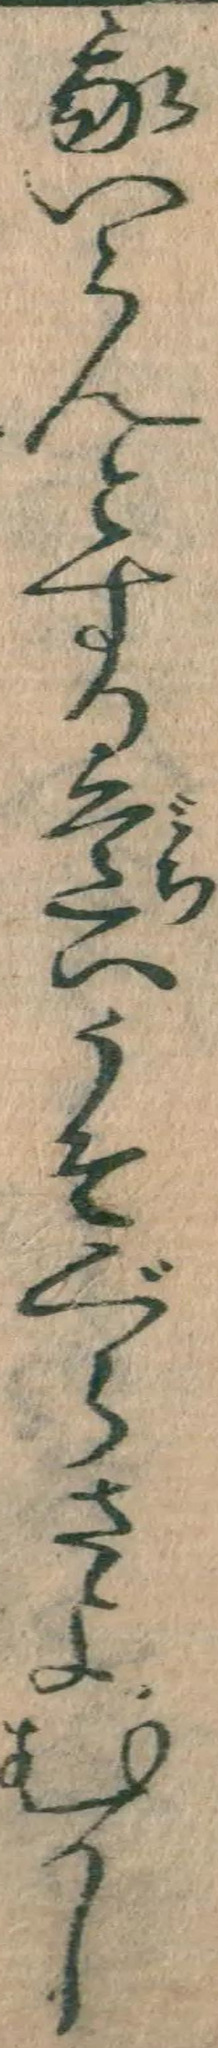我いらんとする道はうそぐらさよ。むかし
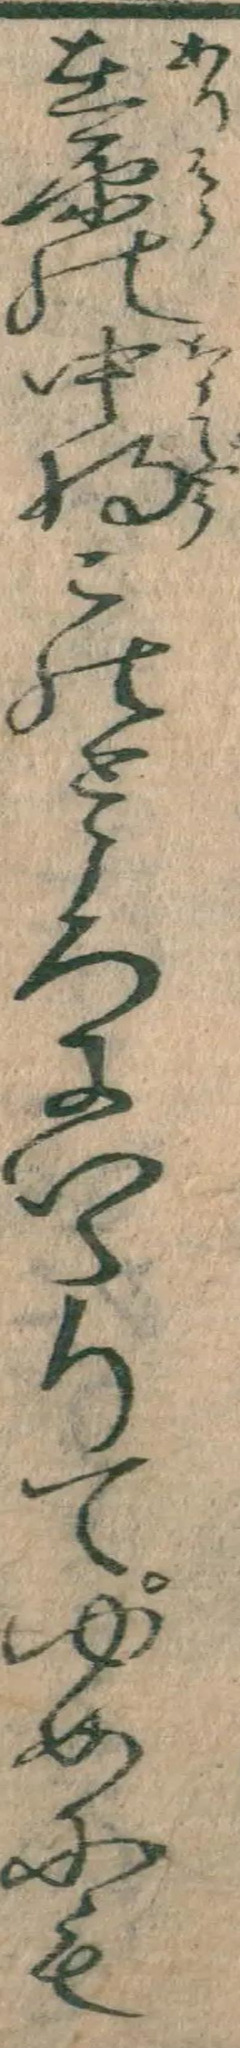在原の中将このところにいたりて。ゆめにも
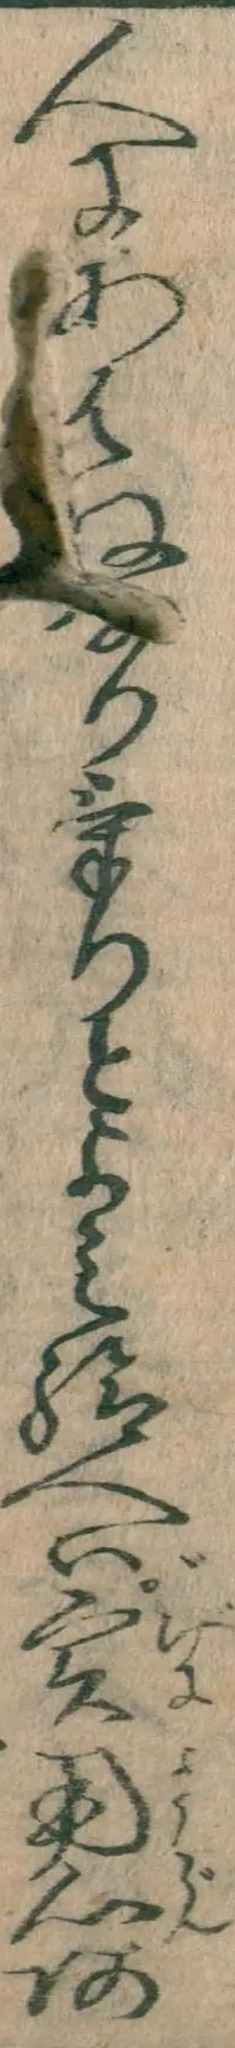人にあはぬなりけりとよみ給へば。実用心あ
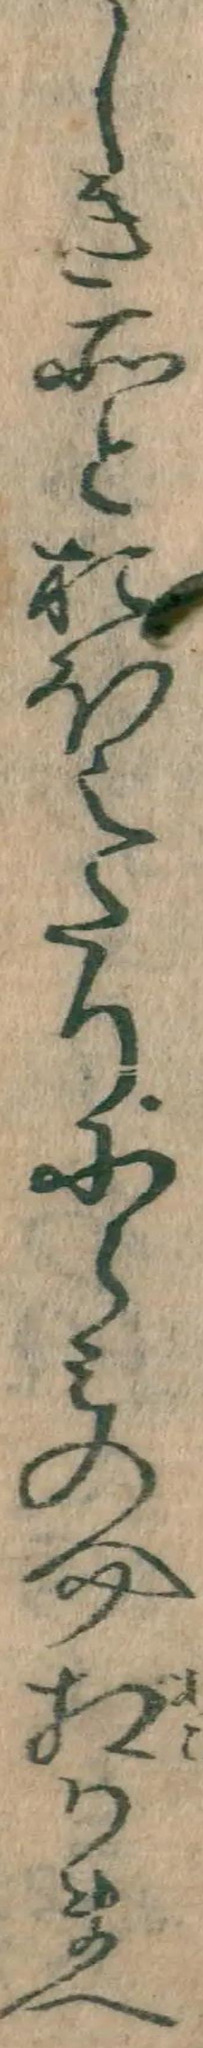しき所とおほえたり、にらみの介相かまへ

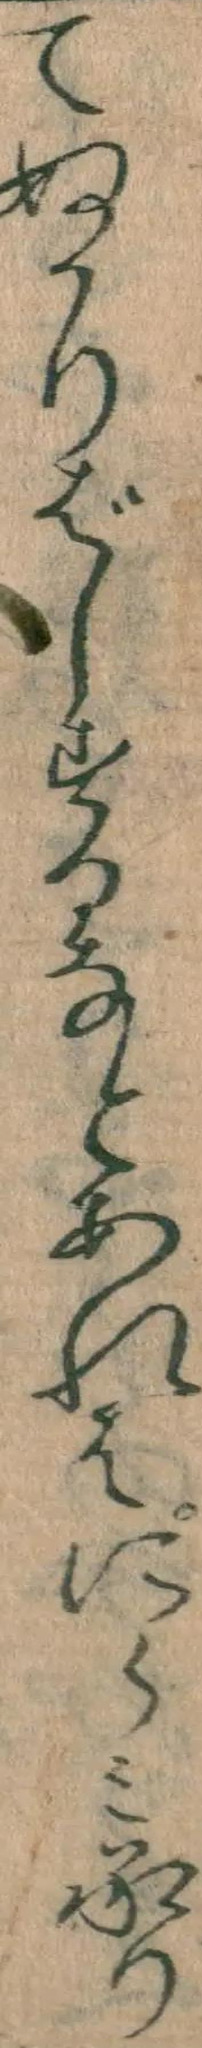てぬかりばしするなとあれは。にらみ承り
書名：竹斎狂歌物語 3巻
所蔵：国立国会図書館 National Diet Library, JAPAN
